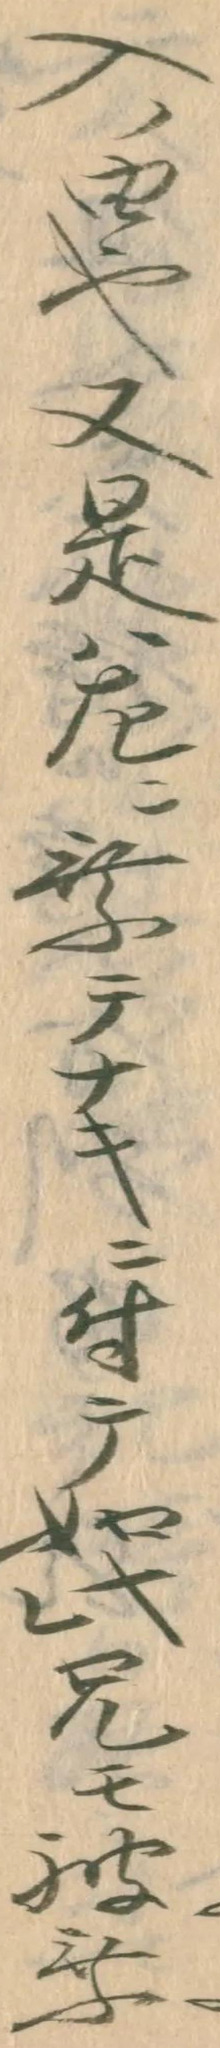入ノ由也又是ハ左ニ乗テナキニ付テ如此兄モ被乗
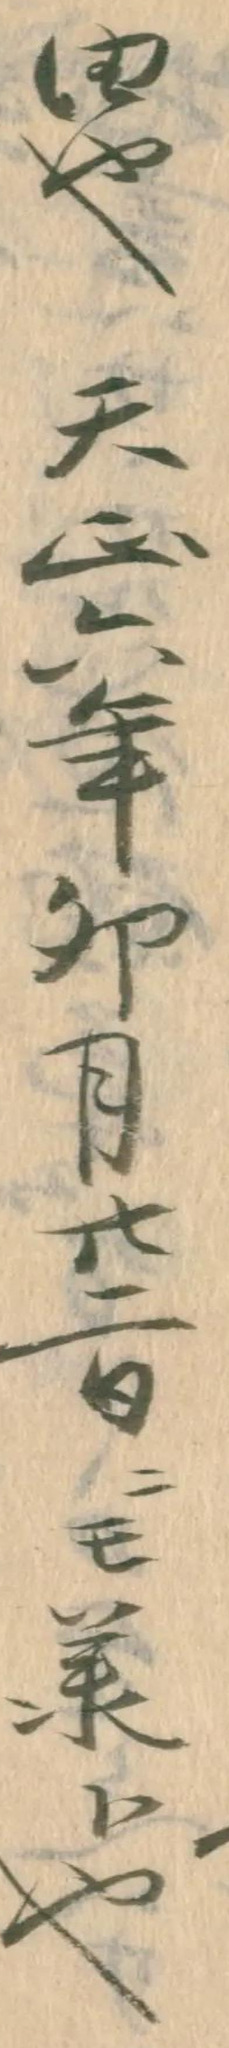由也天正六年卯月廿二日ニモ承ト也
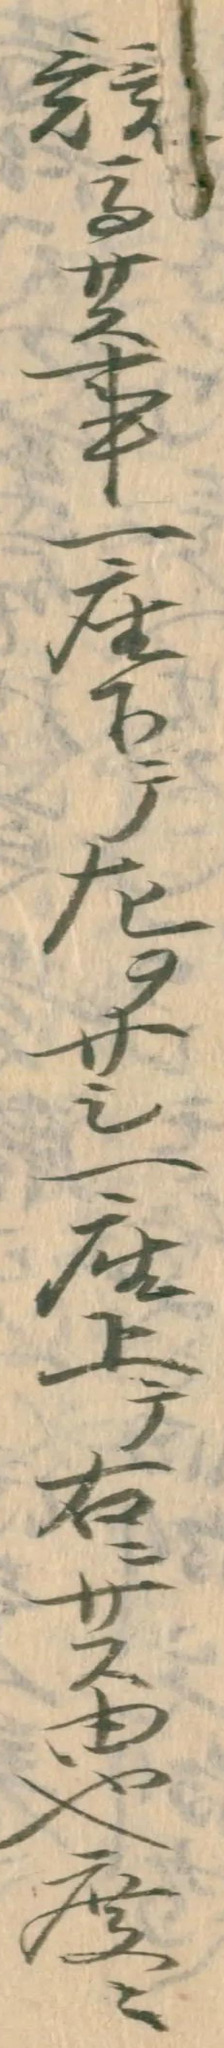一競馬サス事一座下テ左ヲサシ一座上テ右ニサス由也度々
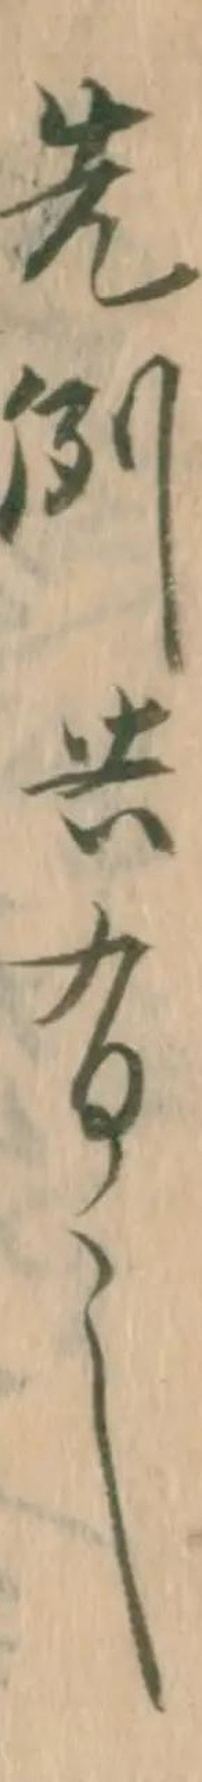先例共有之
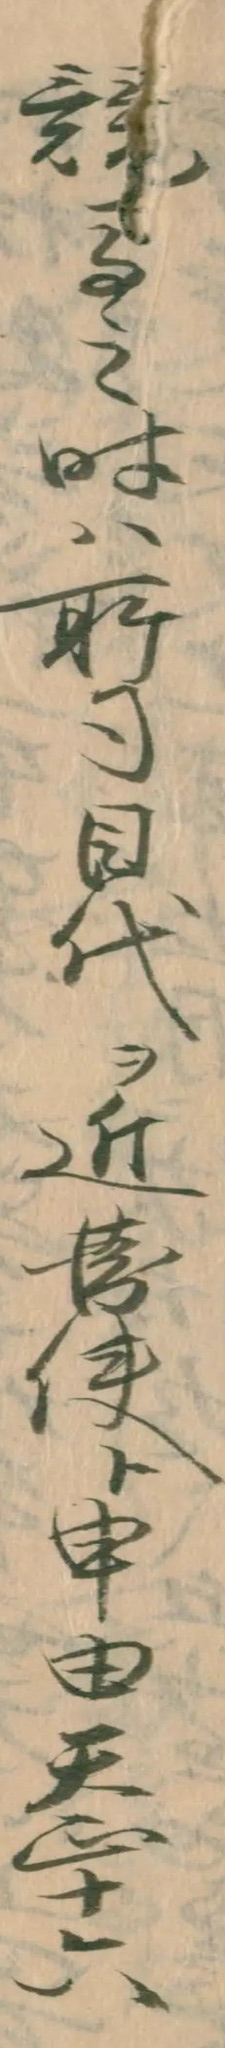一競馬之時ハ所司目代ヲ近衛使ト申由天正十六
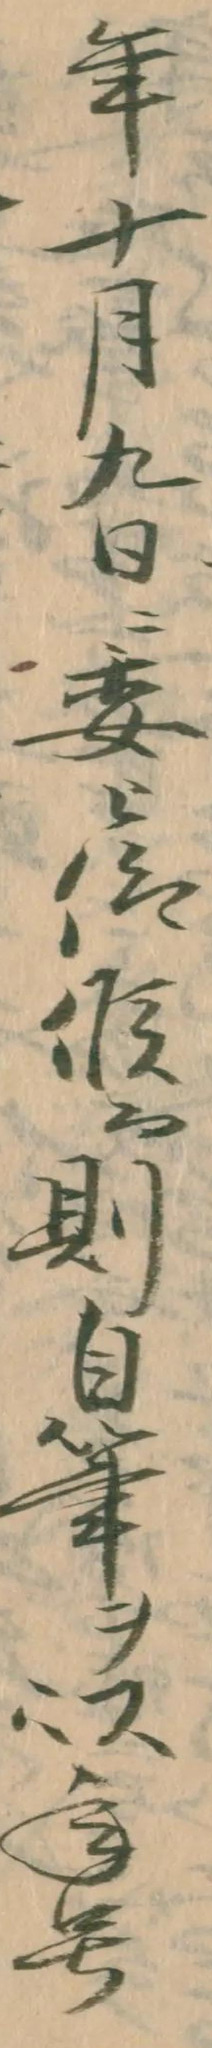年十月九日ニ委被仰候而則自筆ヲ以年号
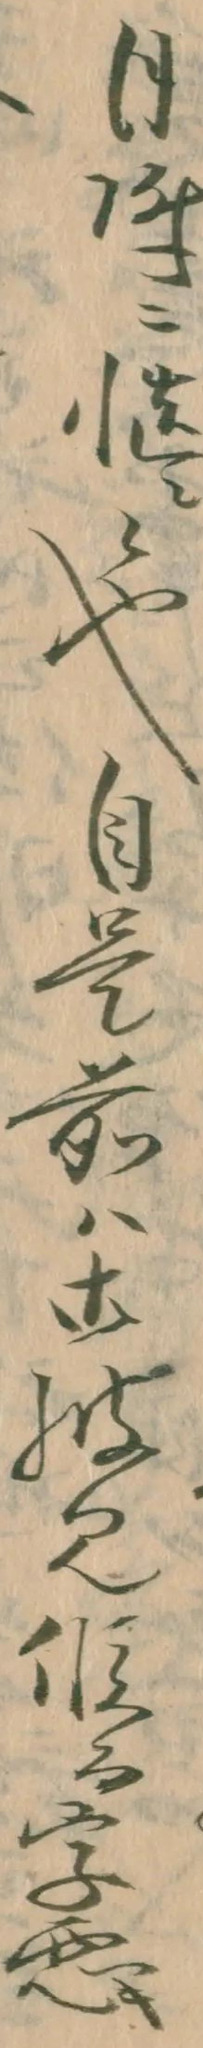月附ニ慥ニ候也自是前ハ御披見候而字悪キ
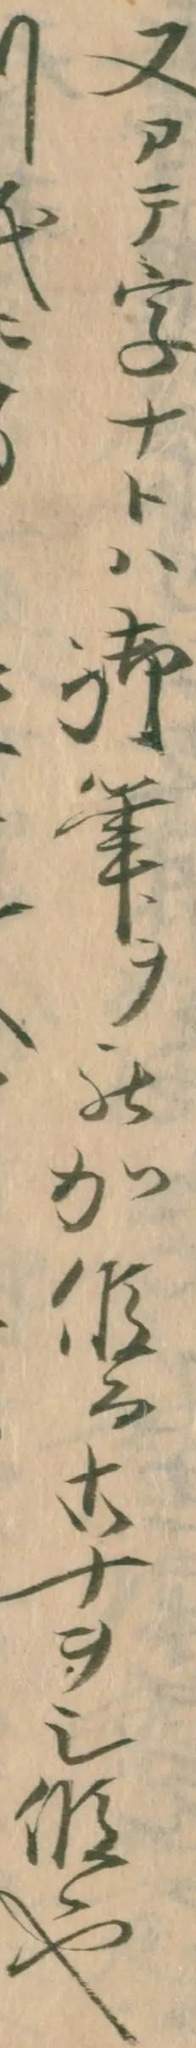又アテ字ナトハ御筆ヲ被加候而御ナヲシ候也
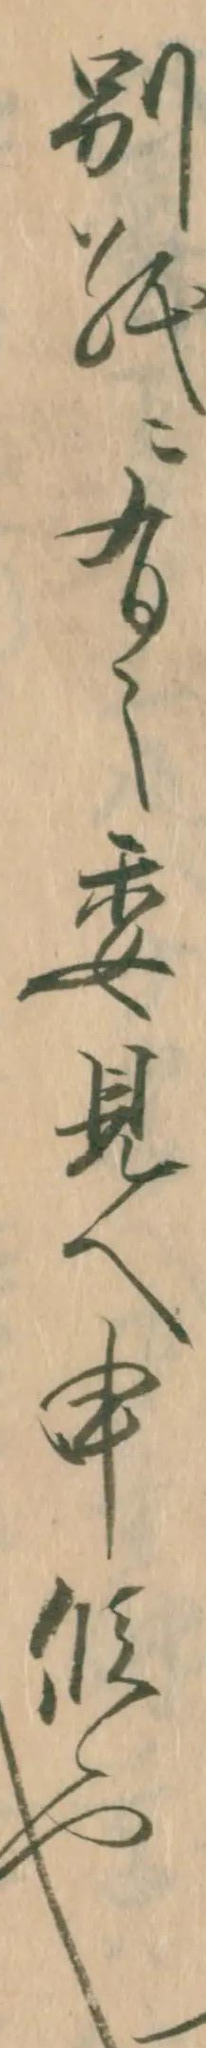別紙ニ有之委見へ申候也
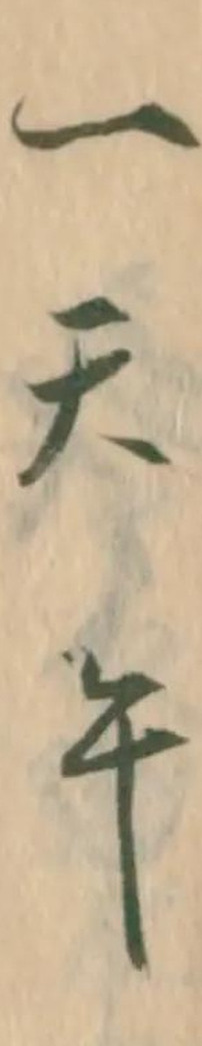一天午
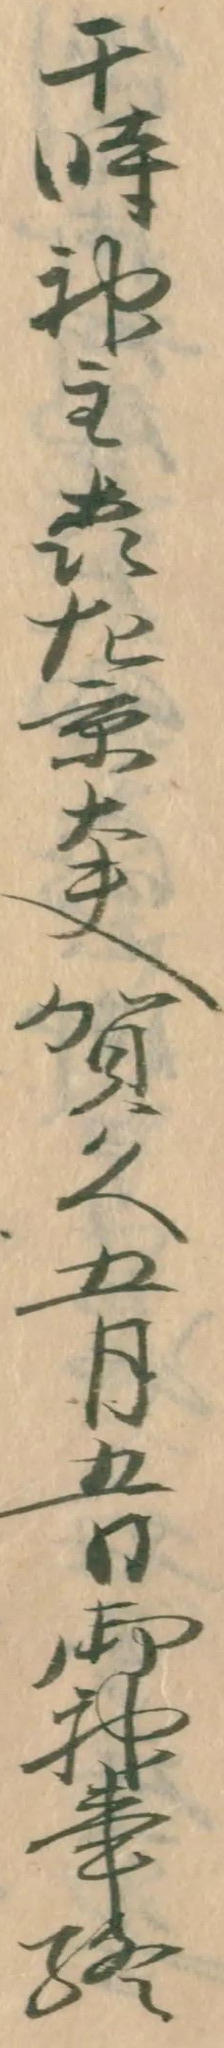于時神主森左京大夫賀久五月五日両神事終
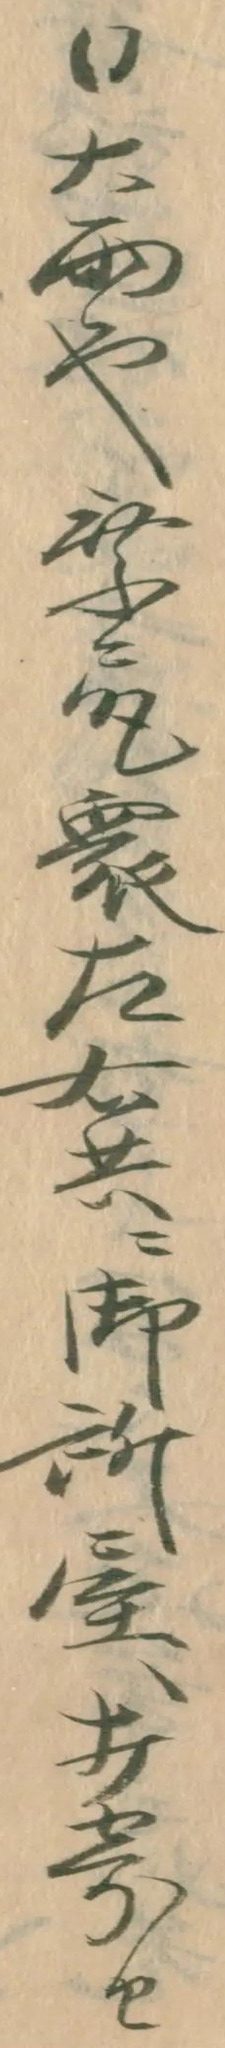日大雨也乗尻衆左右共ニ御所屋へ打寄セ
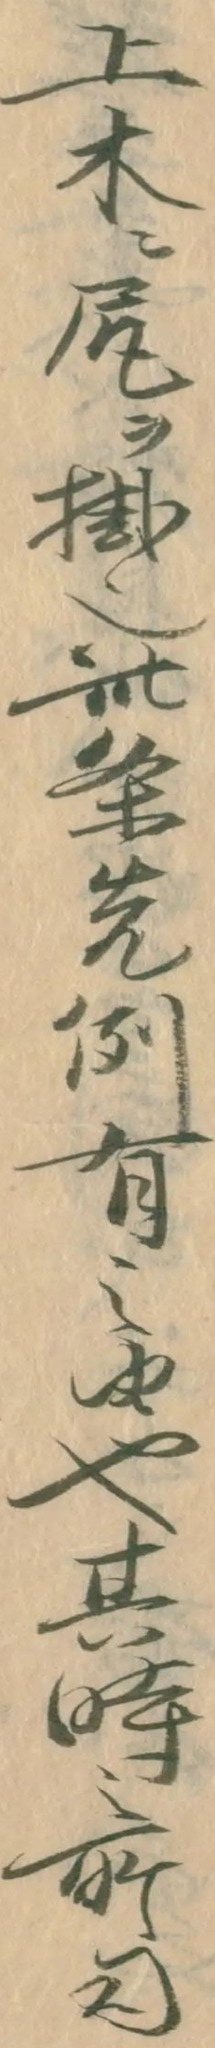上木ニ尻ヲ掛也此条先例有之由也其時之所司

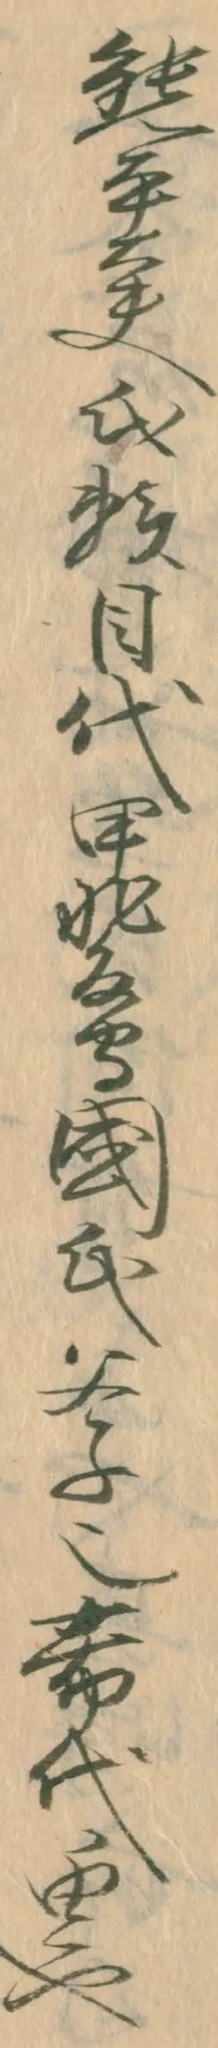熊平大夫氏頼目代甲斐守国氏父子也希代ノ由也
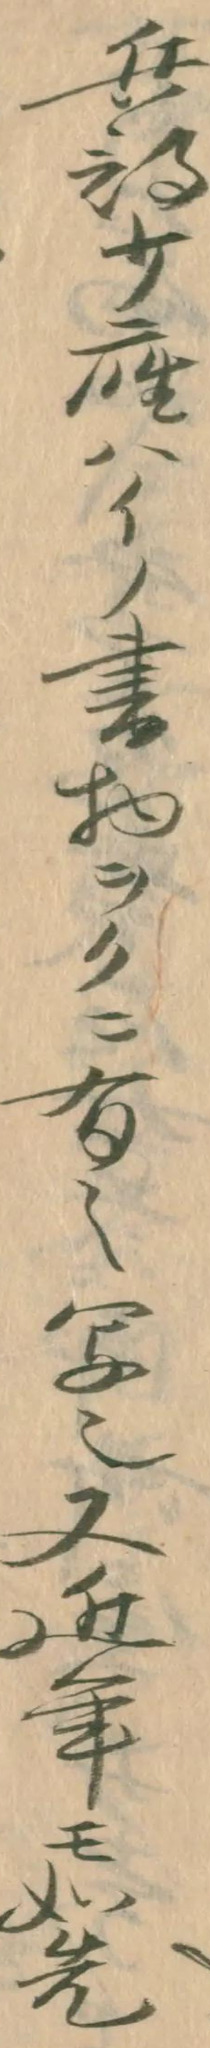兵部少座ハイノ書物ヲクニ有之写也又近年モ如先
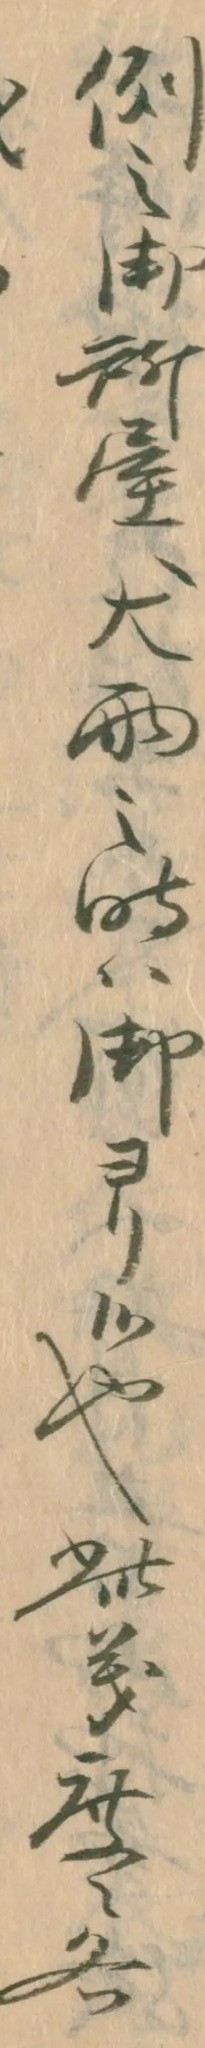例之御所屋へ大雨之時ハ御ヨリ候也此義度々各
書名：賀茂社記録. 第12冊
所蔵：国立国会図書館 National Diet Library, JAPAN
